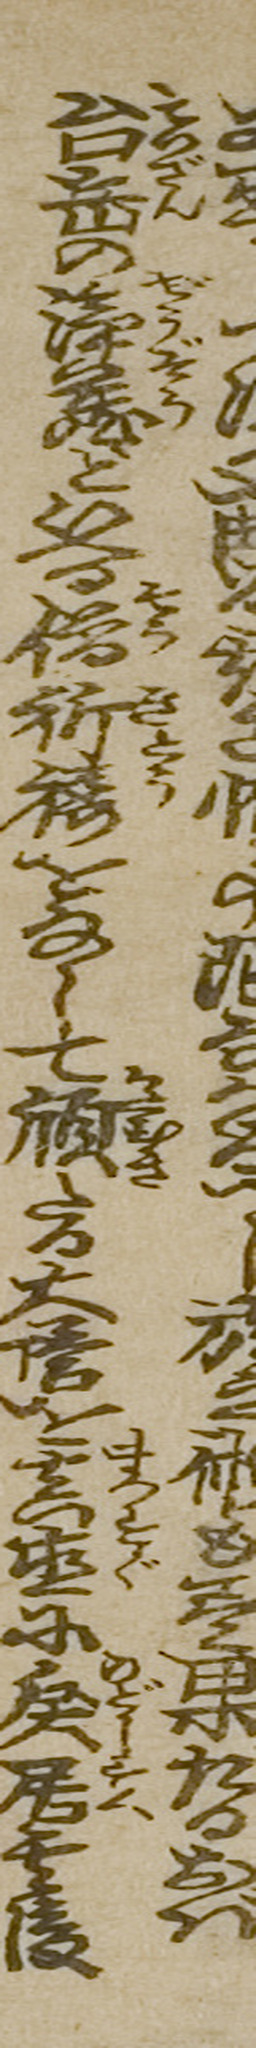台岳の浄蔵といへる僧祈祷をなして傾たる大塔を真直に戻居其後
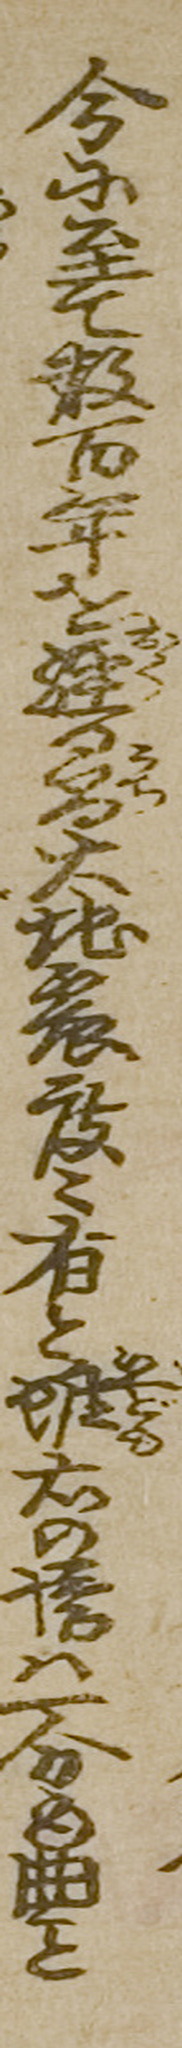今に至て数百年を経る間大地震度々有と雖右の塔は一分も曲こと
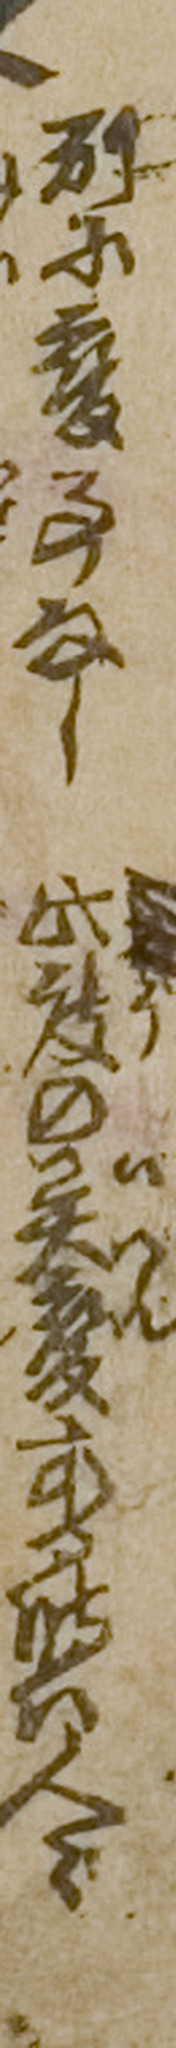別に変事なし此度の異変ある時は人々
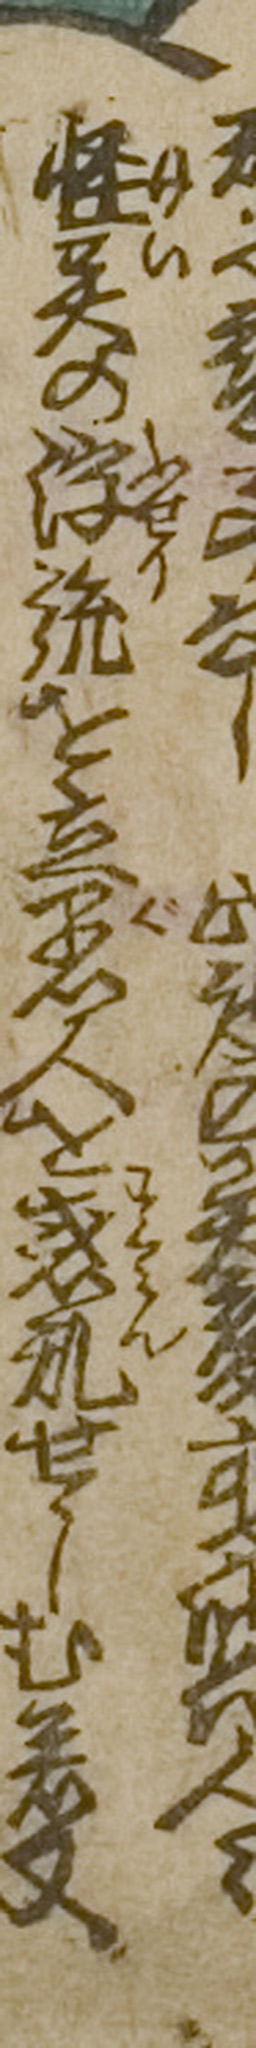怪異の浮流を立愚人を惑乱せしむ若又
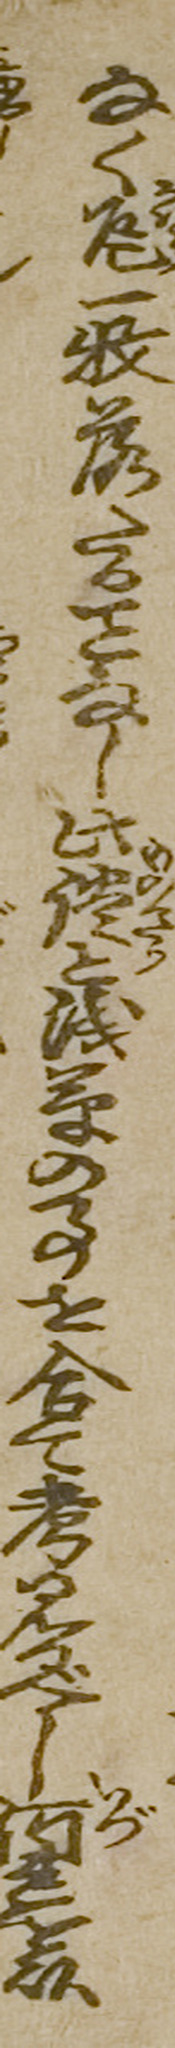なく瓦一枚落たることなし此談と浅草の事を合て考見るべし何れを以
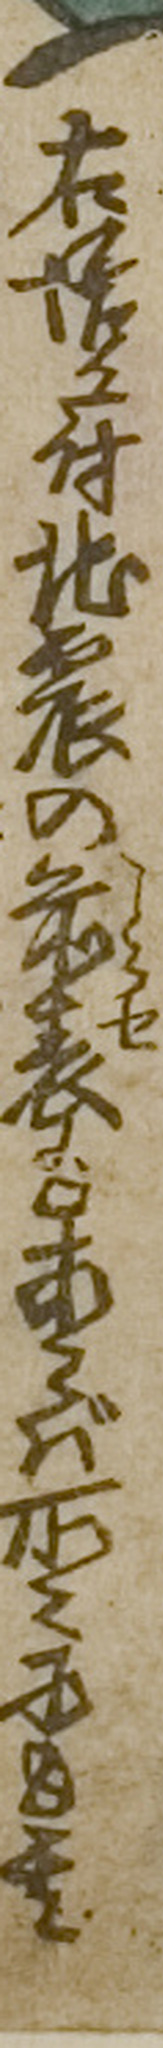右塔に付地震の前表もあらば所々にも其
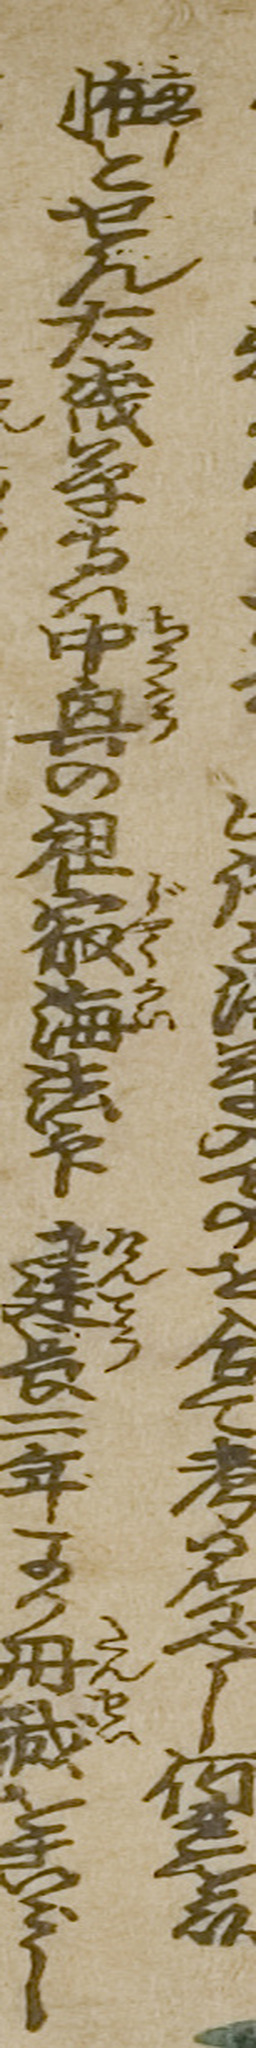怪とせん右浅草寺は中興の祖寂海法印建長二年より丹誠をこらし
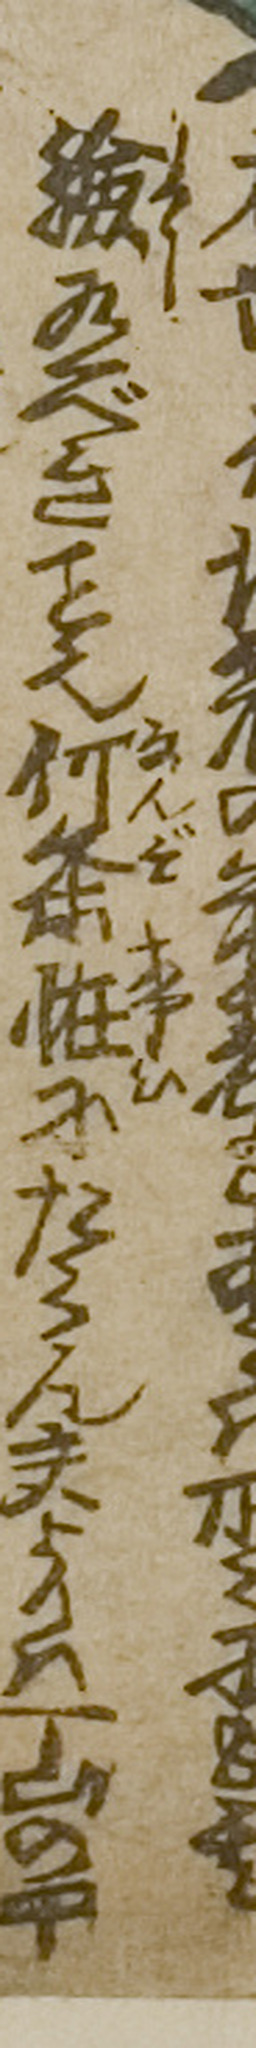験有べきこと也何条怪にたらん夫よりは一山の中
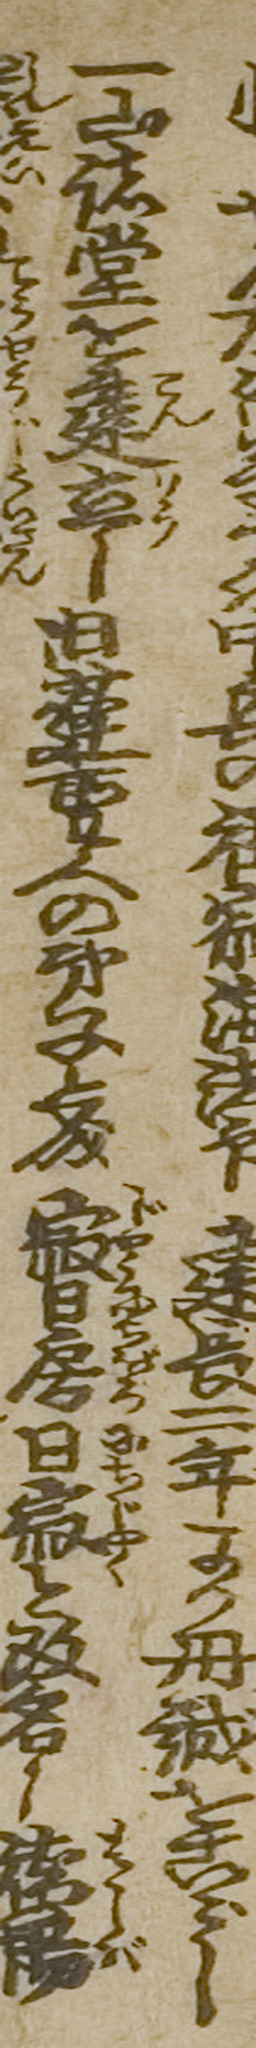一山諸堂を建立し日蓮聖人の弟子と成寂日房日寂と改名し橋場
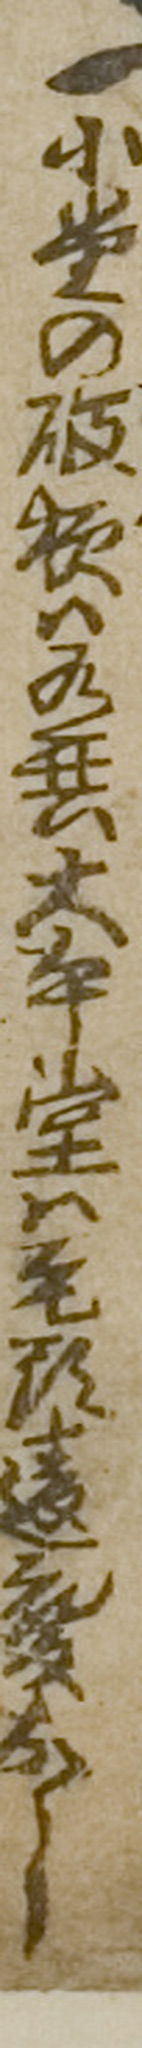に堂の破損は有共大本堂は毛頭違変なし
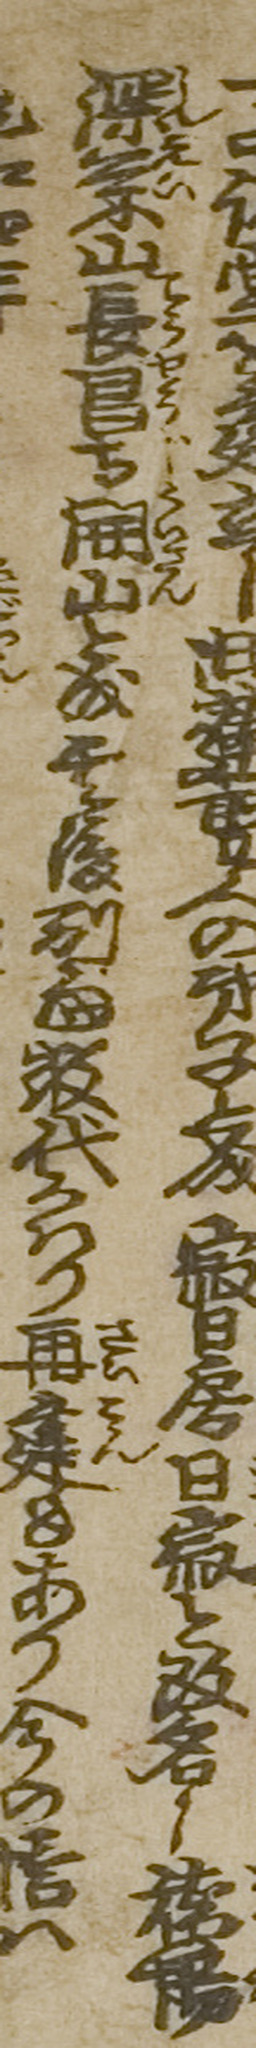深栄山長昌寺開山と成其後別当数代かわり再建もあり今の塔は
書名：浅草寺大塔解釈
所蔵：東京大学総合図書館 General Library in the University of Tokyo, JAPAN
